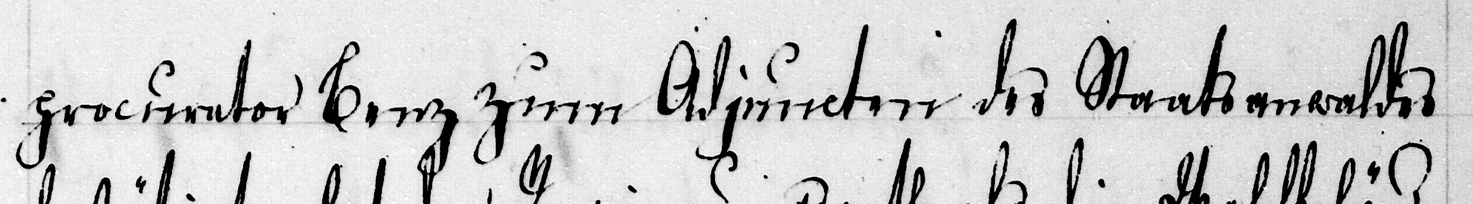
procurator Benz zum Adjuncten des Staatsanwaldes
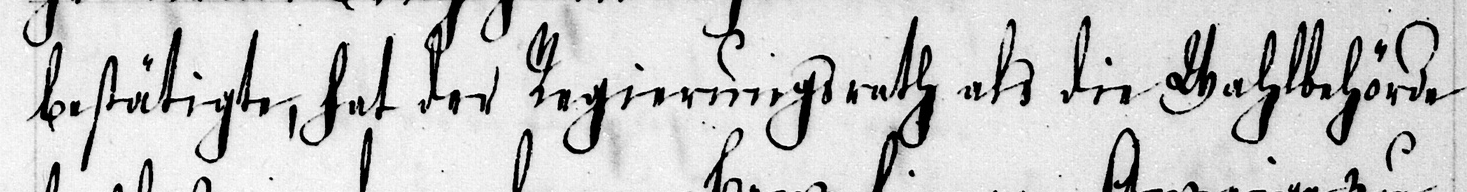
bestätigte, hat der Regierungsrath als die Wahlbehörde
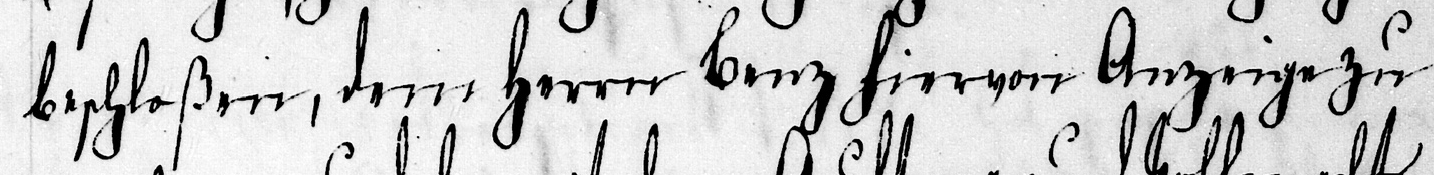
beschloßen, dem Herrn Benz hiervon Anzeige zu
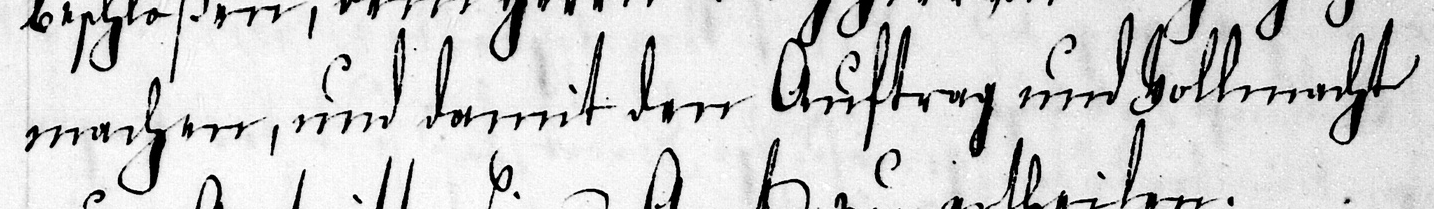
machen, und damit den Auftrag und Vollmacht
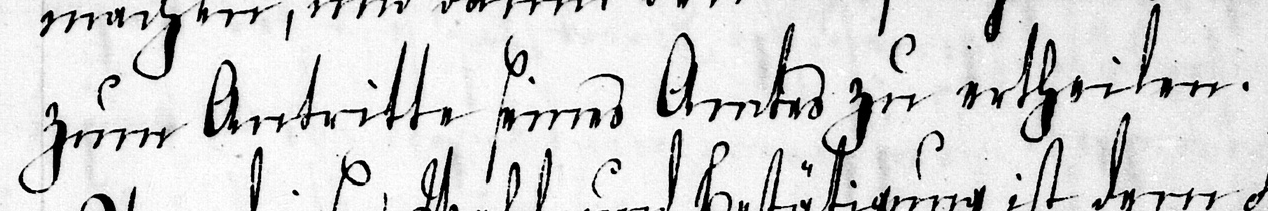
zum Antritte seines Amtes ertheilen.
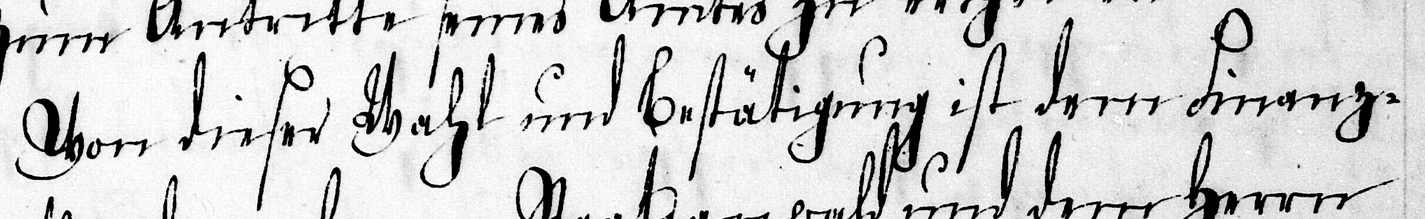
Von dieser Wahl und Bestätigung ist dem Finanz¬
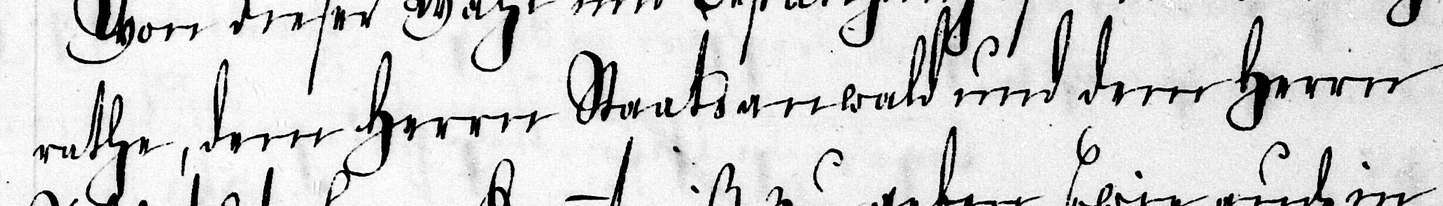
rathe, dem Herrn Staatsanwald und dem Herrn
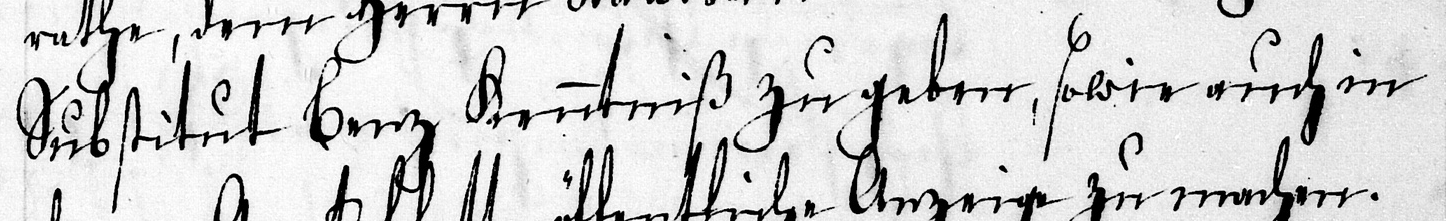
Substitut Benz Kenntniß zu geben, sowie auch in
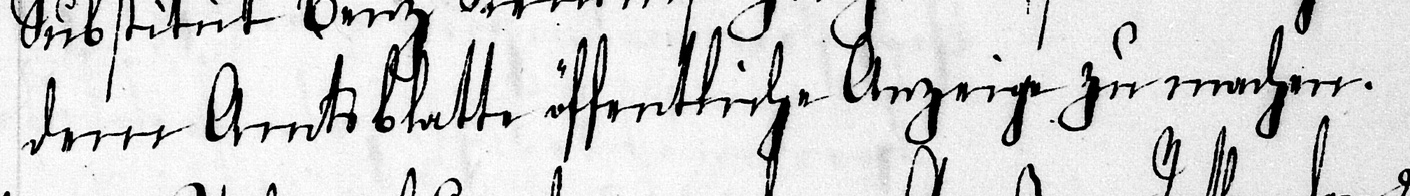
dem Amtsblatte öffentliche Anzeige zu machen.
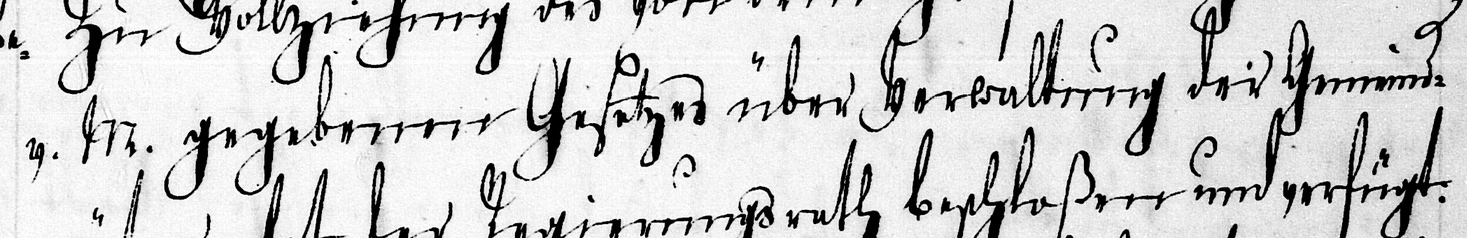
v. M. gegebenen Gesetzes über Verwaltung der Gemeind¬
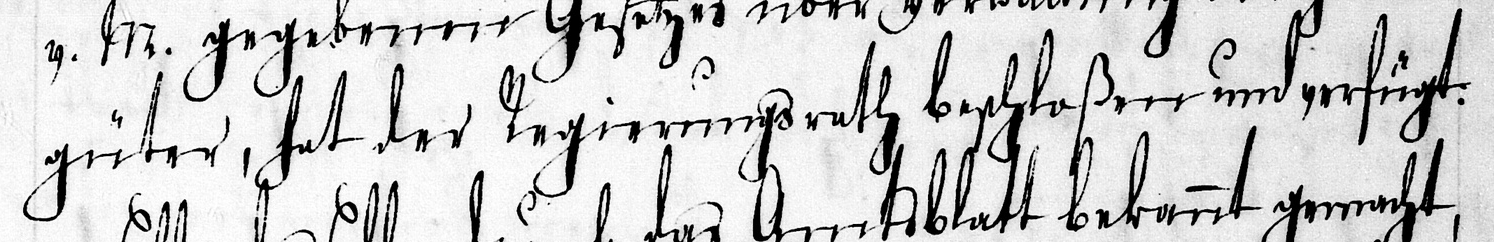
güter, hat der Regierungsrath beschloßen und verfügt:
